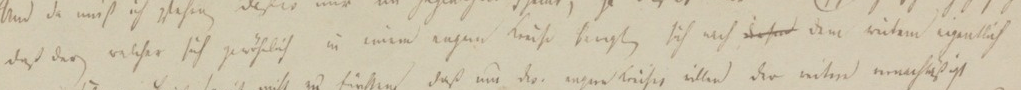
daß der, welcher sich gewöhnlich in einem engern Kreise bewegt, sich nach diesen dem weitern eigentlich
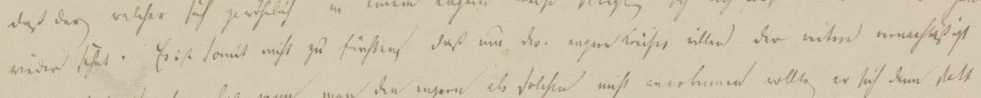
wieder sehnt. Es ist somit nicht zu fürchten, daß um des engern Kreises willen der weitere vernachläßigt
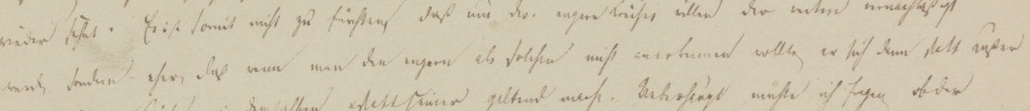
werden, sondern eher, daß wenn man den engern als solchen nicht anerkennen wollte, er sich dann statt außer
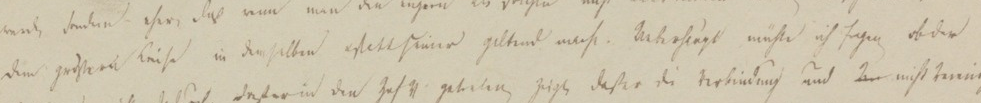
dem größeren Kreise in dem selben & statt seiner geltend mache. Ueberhaupt möchte ich fragen, ob der
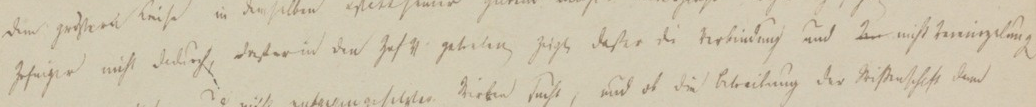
Zofinger nicht dadurch, daß er in den Zof.V. getreten, zeigt, daß er die Verbindung und nicht Vereinzelung,
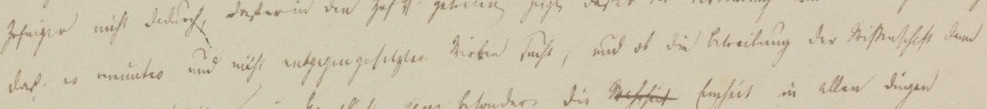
daß er vereintes und nicht entgegengesetztes Wirken sucht, und ob die Betreibung der Wissenschaft denn
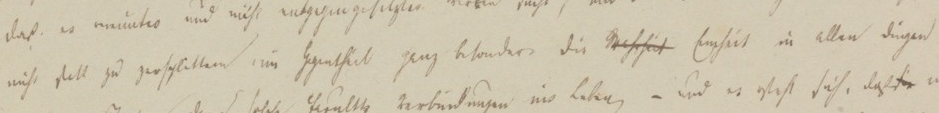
nicht statt zu zersplittern im Gegentheil ganz besonders die Wahrheit Einheit in allen Dingen
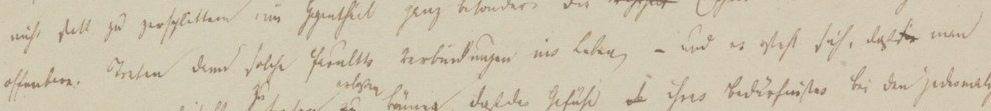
offenbare. Treten dann solche FaculttsVerbindungen ins Leben – und es vsteht sich, daß sie man
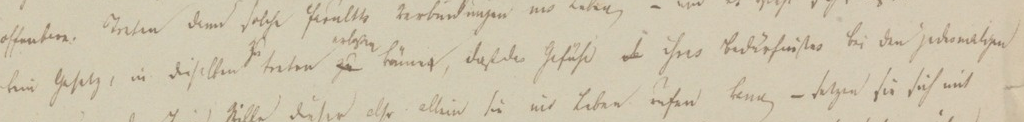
kein Gesetz, in dieselben zu treten zuerlassen könne, daß das Gefühl ihres Bedürfnisses bei den jedesmaligen
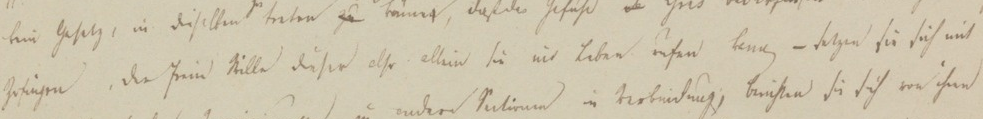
Zofingern, der freie Wille dieser also allein sie ins Leben rufen kann – setzen sie sich mit
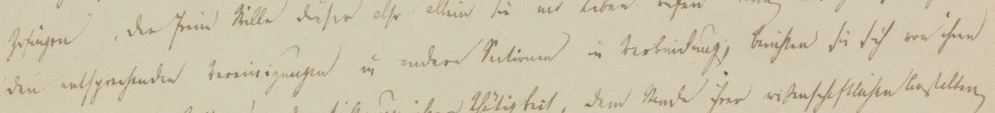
den entsprechenden Vereinigungen in andern Sectionen in Verbindung, berichten sie sich von ihren
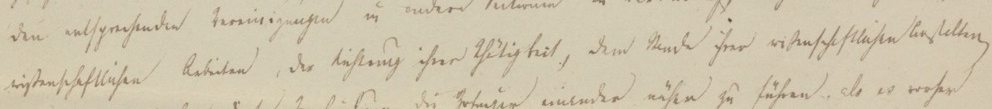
wissenschaftlichen Arbeiten, der Richtung ihrer Thätigkeit, dem Stande ihrer wissenschaftlichen Anstalten,
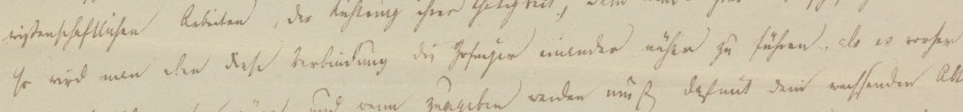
so wird man eben diese Verbindung die Zofinger einander näher zu führen, als es vorher
